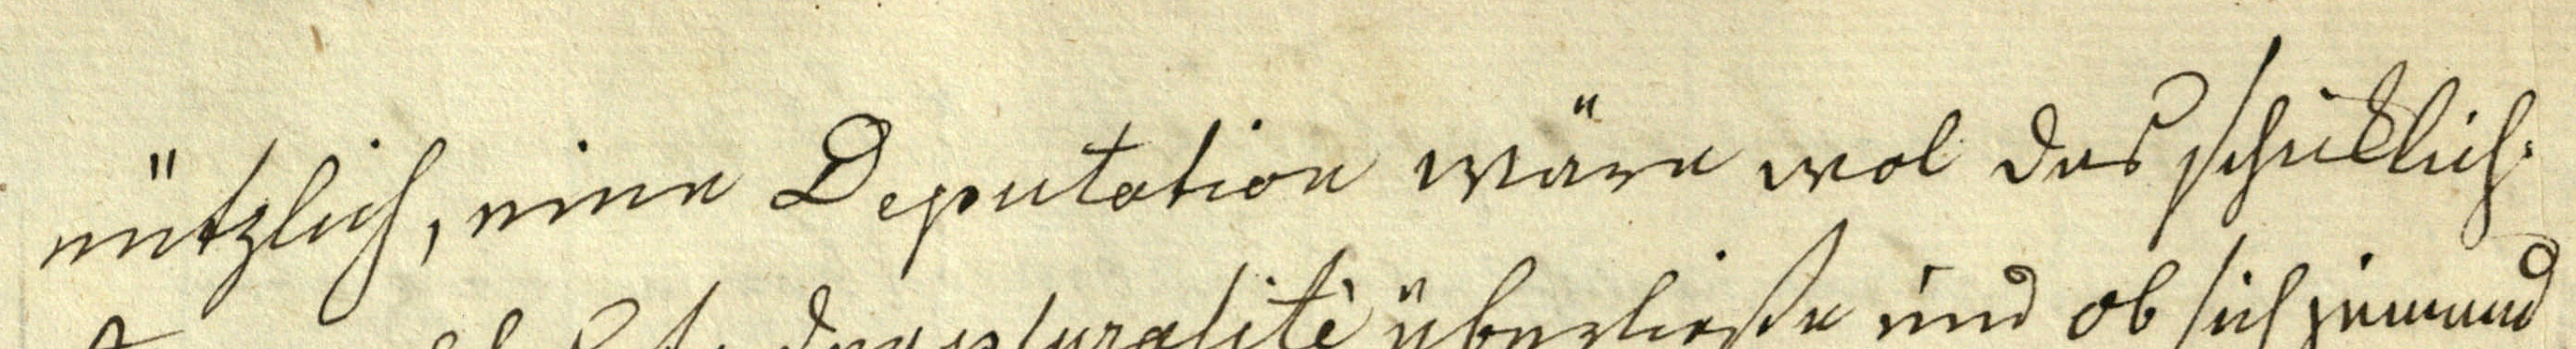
nützlich, eine Deputation wäre wol das schicklich¬
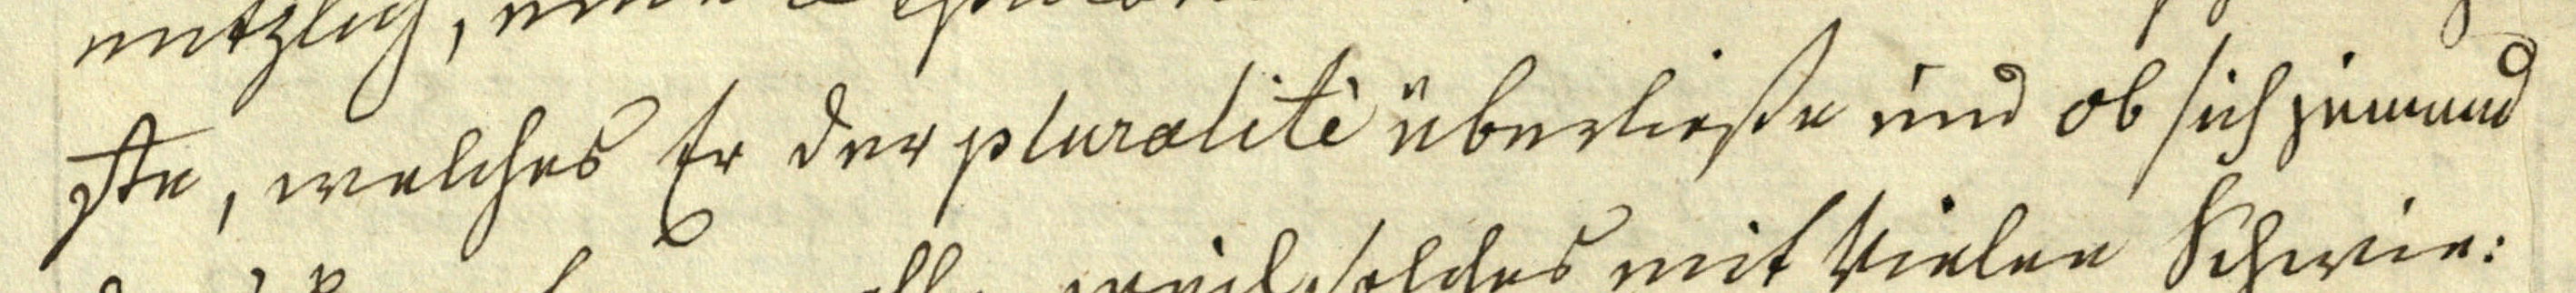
ste, welches Er der pluralite überließe und ob sich jemand
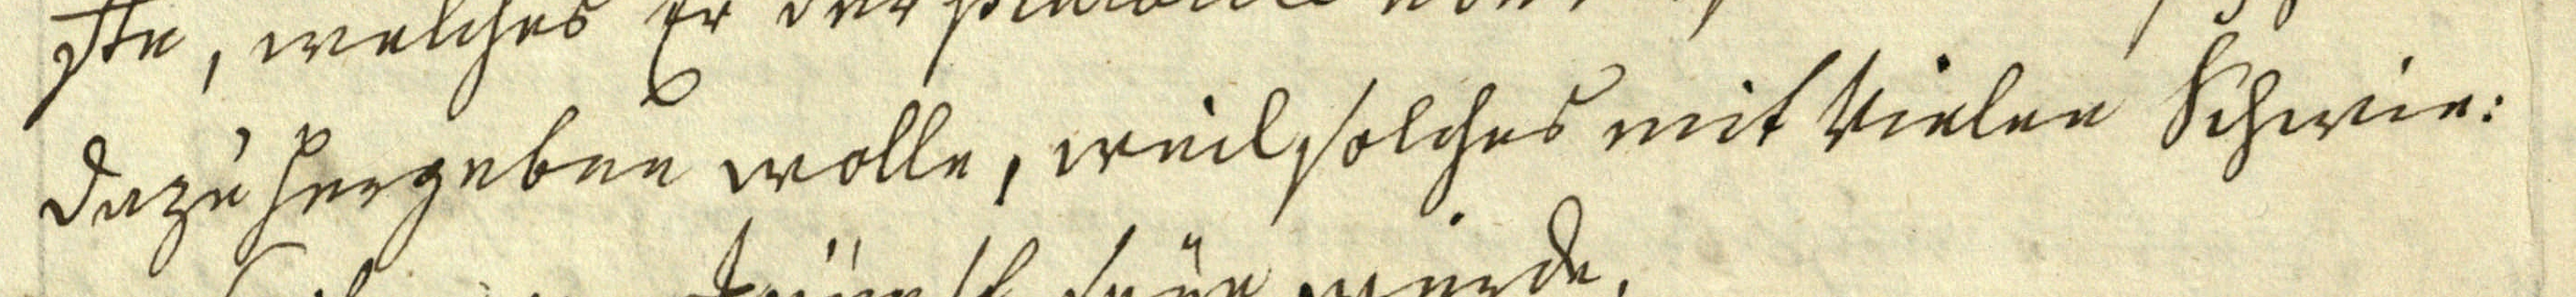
dazu hergeben wolle, weil solches mit vielen Schwie¬
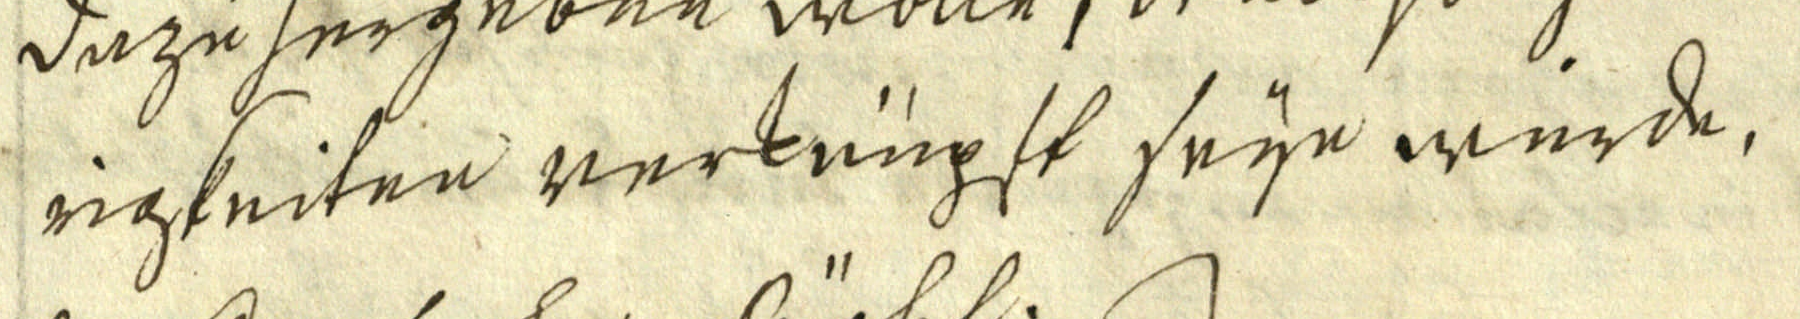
rigkeiten verknüpft seÿn würde.
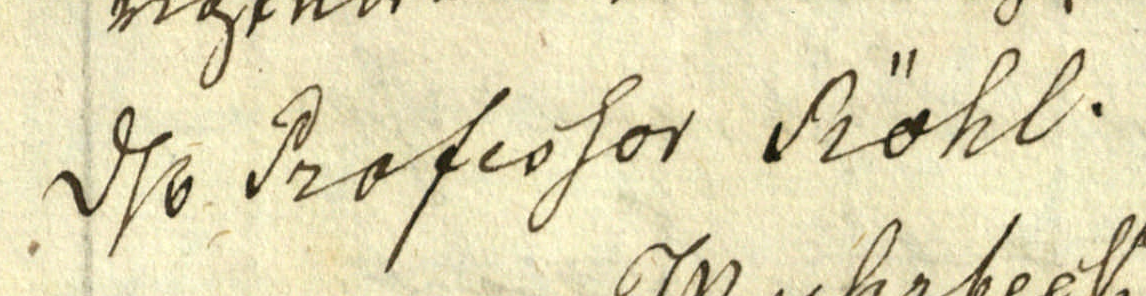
dh Professor Röhl.
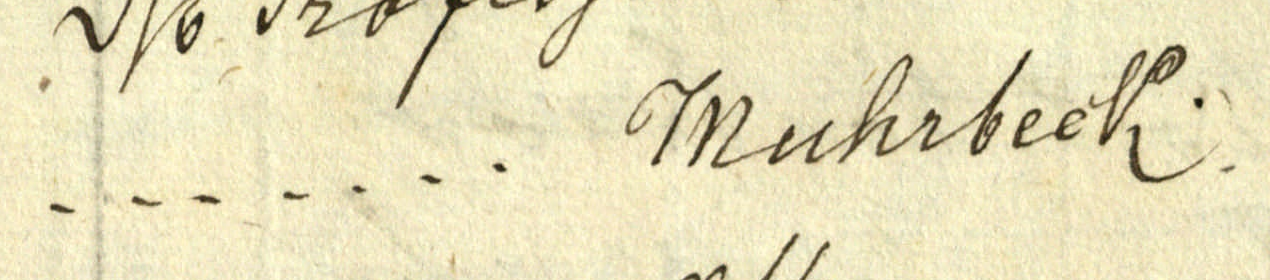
Muhrbeck.
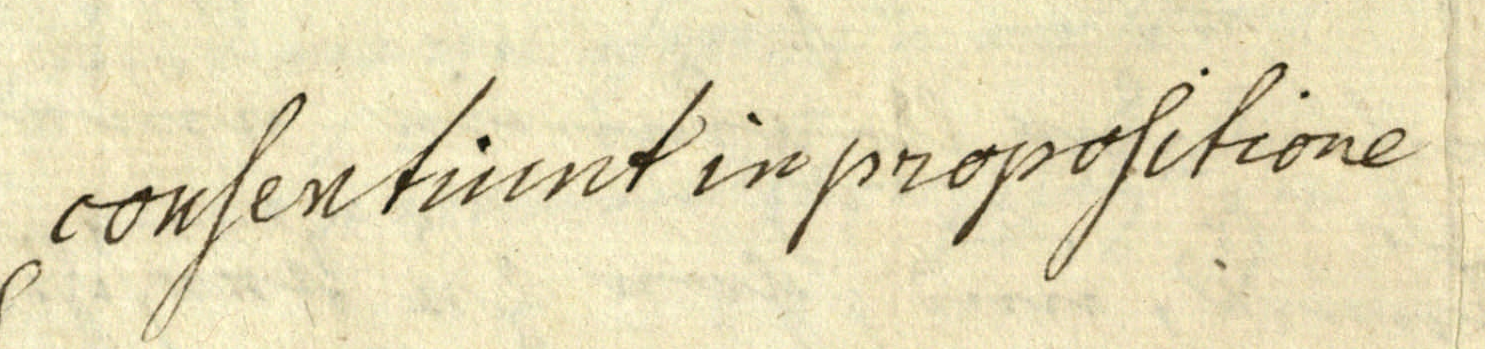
consentiunt in propositione
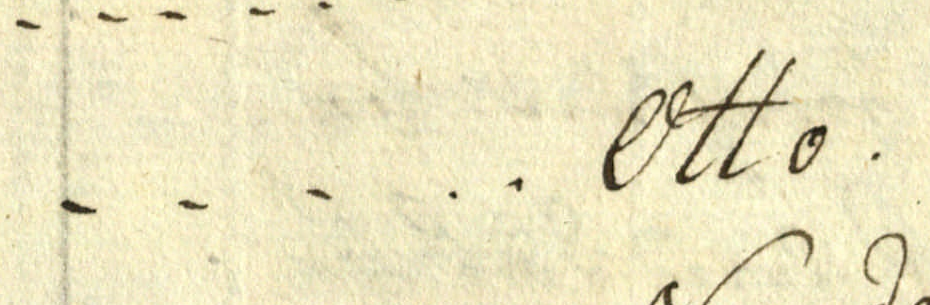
Otto.
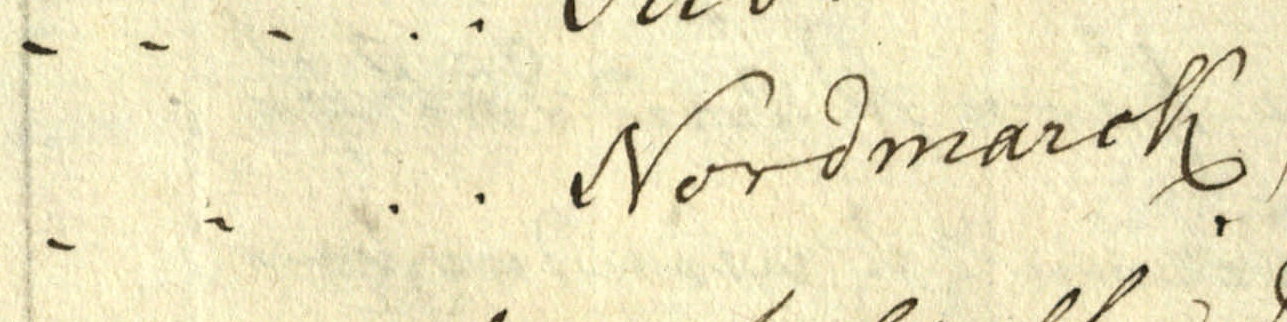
Nordmarck
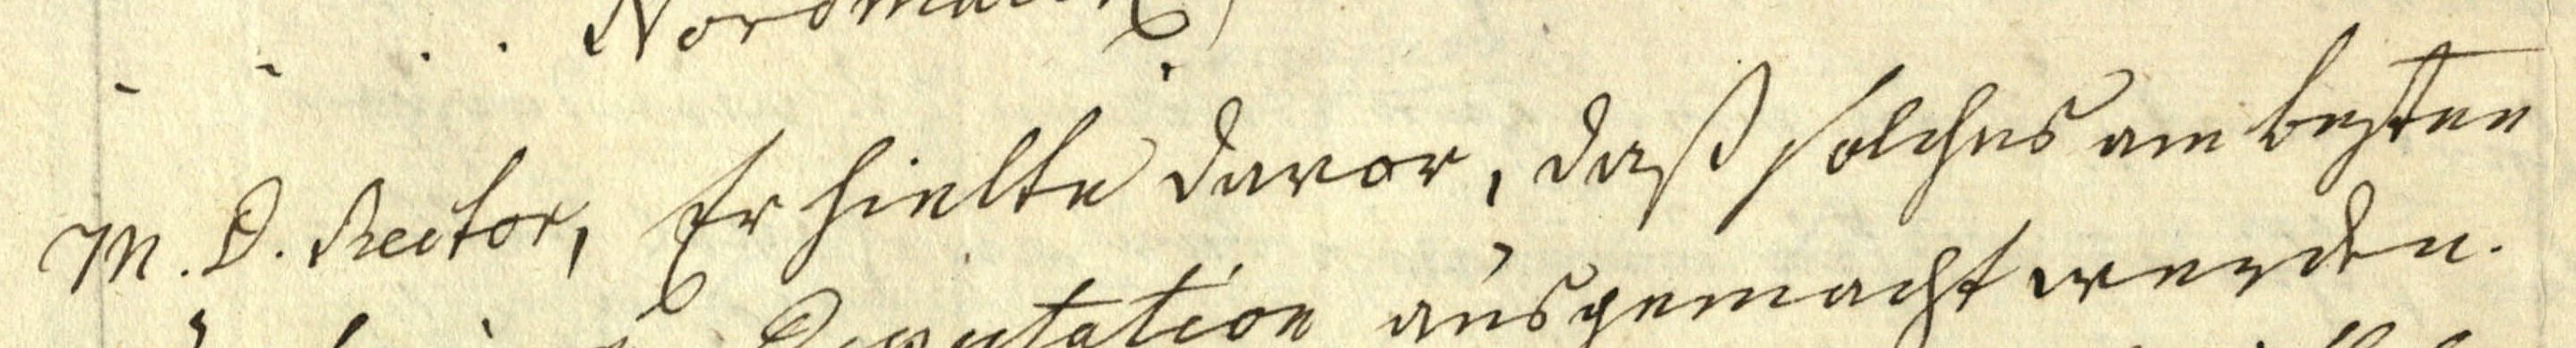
M. D. Rector, Er hielte davor, daß solches am besten
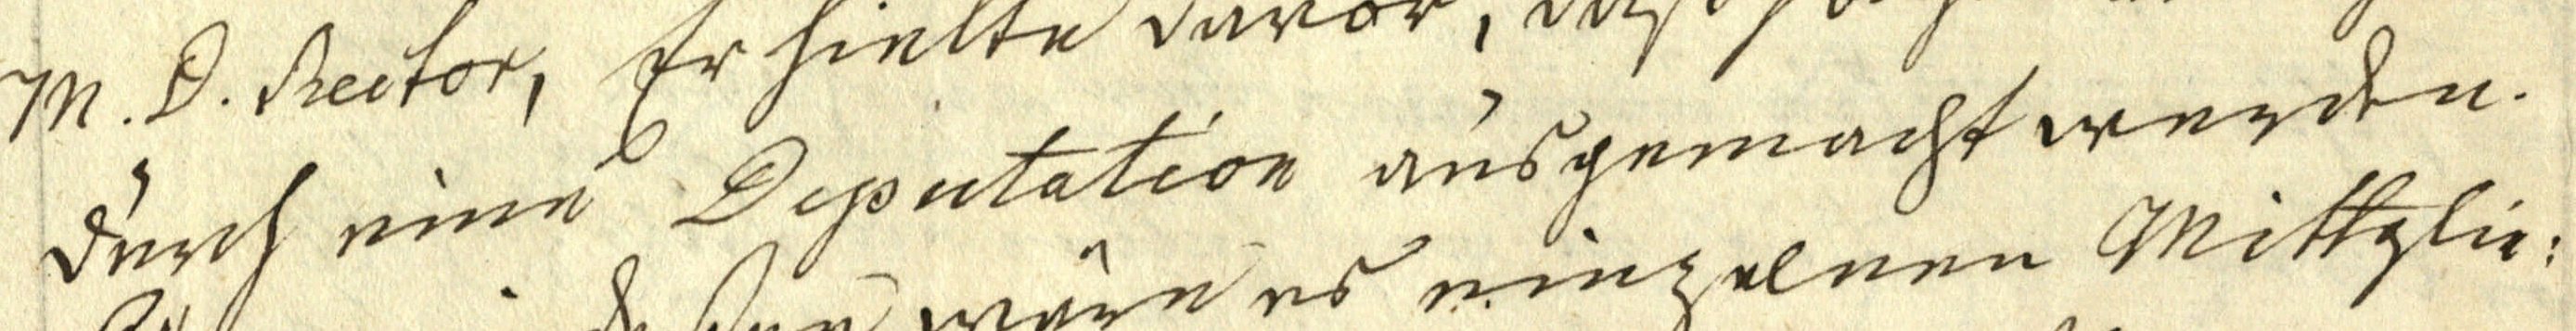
durch eine Deputation ausgemacht werden
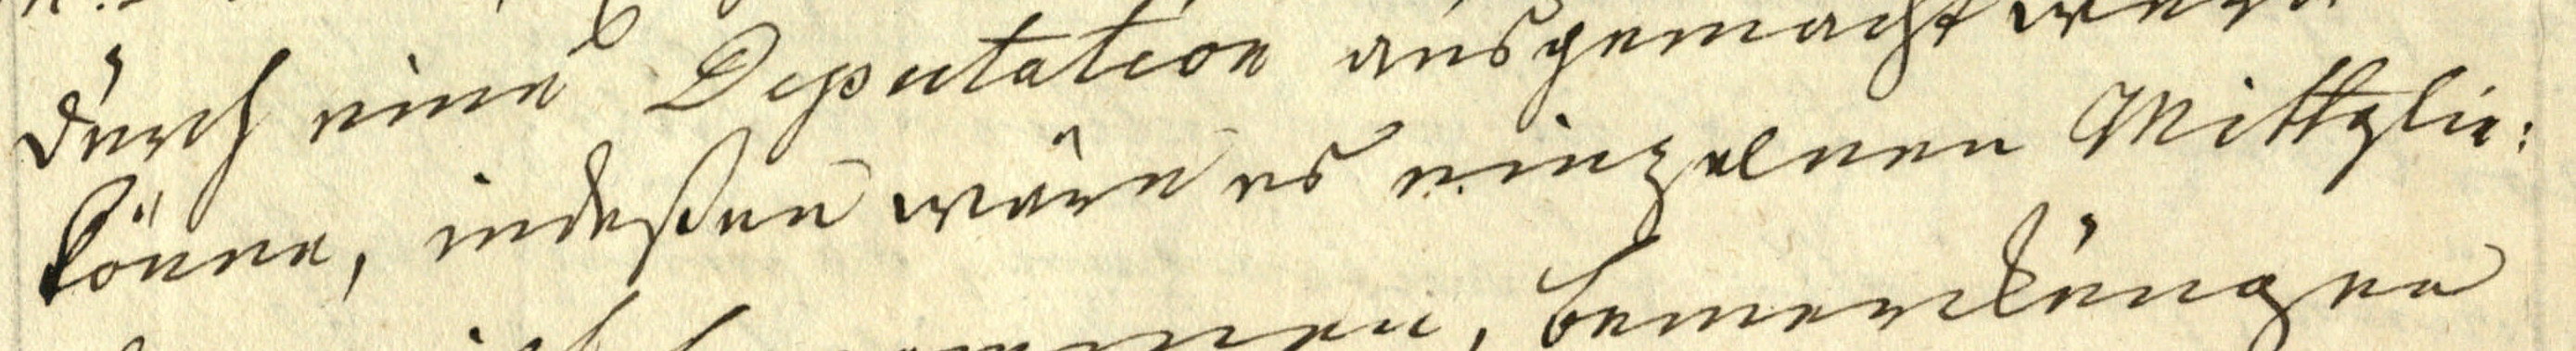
könne, indeßen wäre es einzelnen Mittglie¬
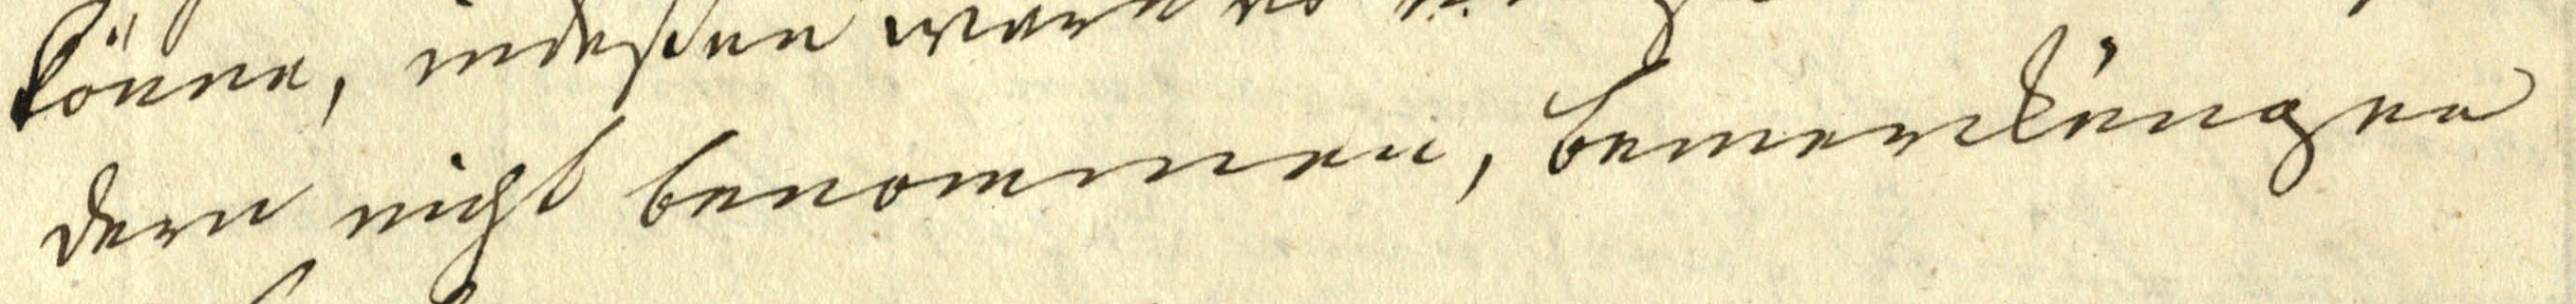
dern nicht benommen, Bemerckungen
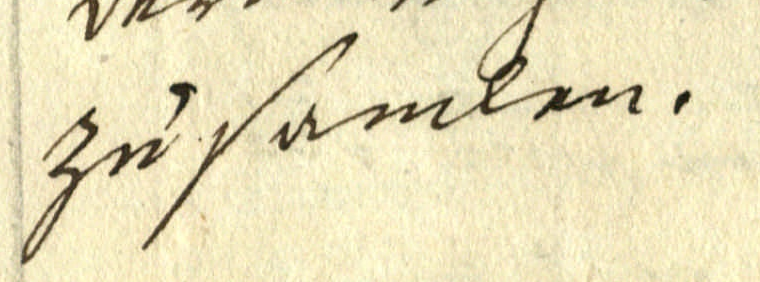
zu samlen.
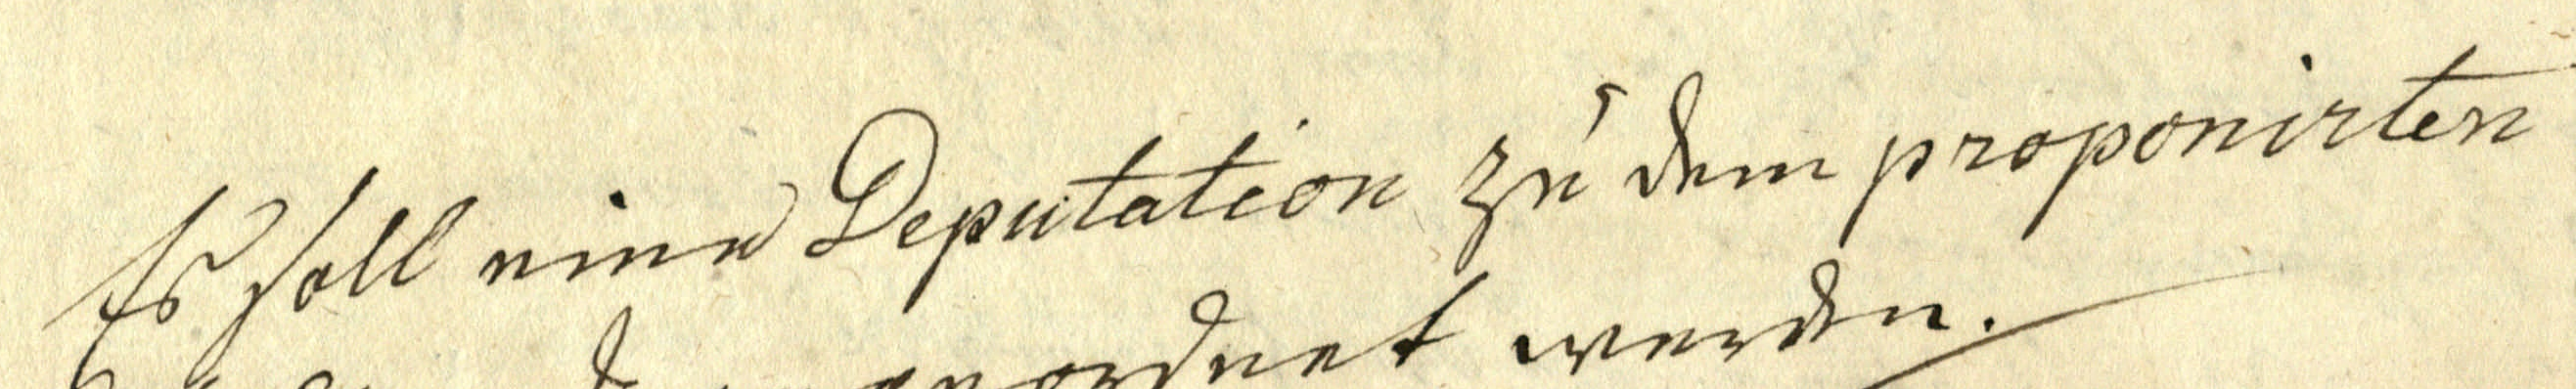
Es soll eine Deputation zu dem proponirten
